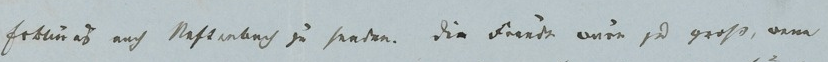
Erklärung nach Neftenbach zu senden. Die Freude wäre zu groß, wenn
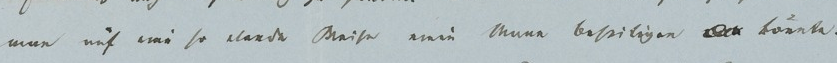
man auf eine so elende Weise einen Mann beseitigen könnte.
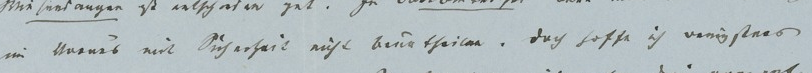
im Voraus mit Sicherheit nicht beurtheilen. Doch hoffe ich wenigstens
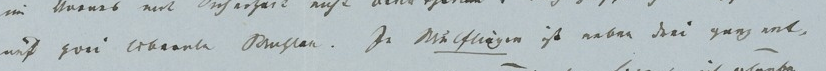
auf zwei liberale Wahlen. In Wülflingen ist neben drei ganz ent-
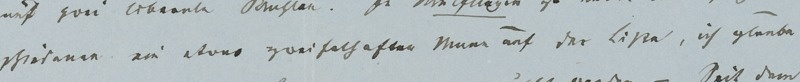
schiedenen ein etwas zweifelhafter Mann auf der Liste, ich glaube
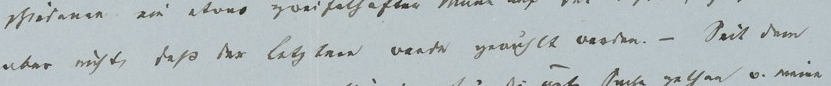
aber nicht, daß der Letztere werde gewählt werden. – Seit dem
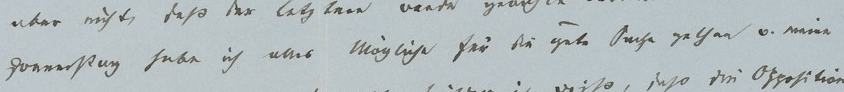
Donnerstag habe ich alles Mögliche für die gute Sache gethan &. meine
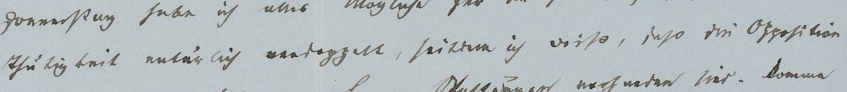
Thätigkeit natürlich verdoppelt, seitdem ich weiß, daß die Opposition
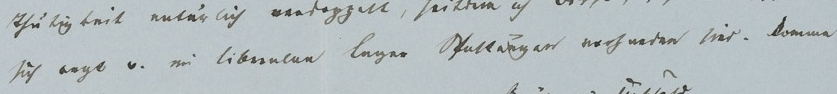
sich regt &. im liberalen Lager Spaltungen vorhanden sind. Komme
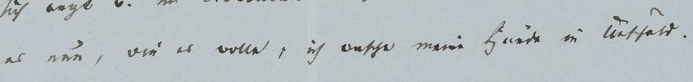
es nun, wie es wolle, ich wasche meine Hände in Unschuld.
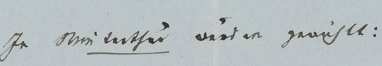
In Winterthur wurden gewählt
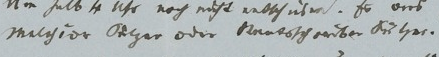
Melchior Sulzer oder Staatsschreiber Sulzer.
